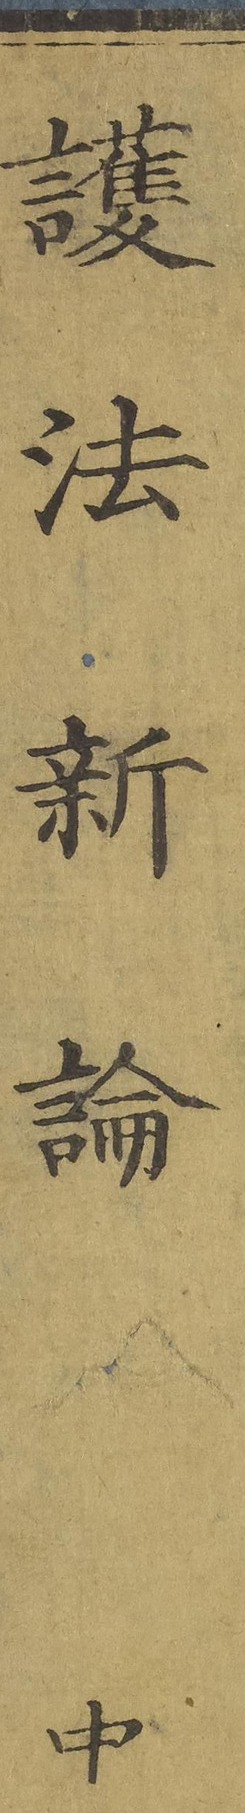護法新論中

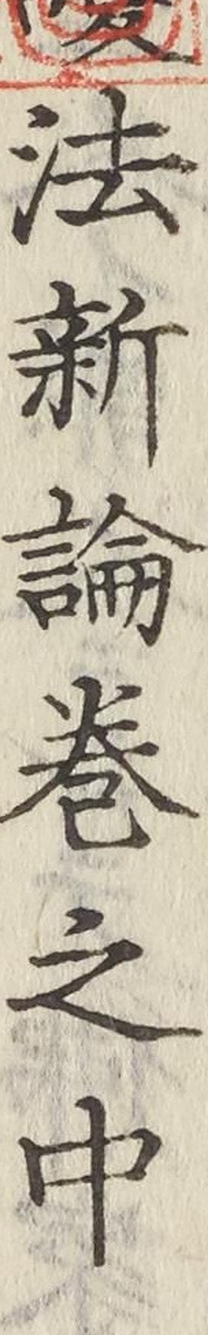護法新論巻之中
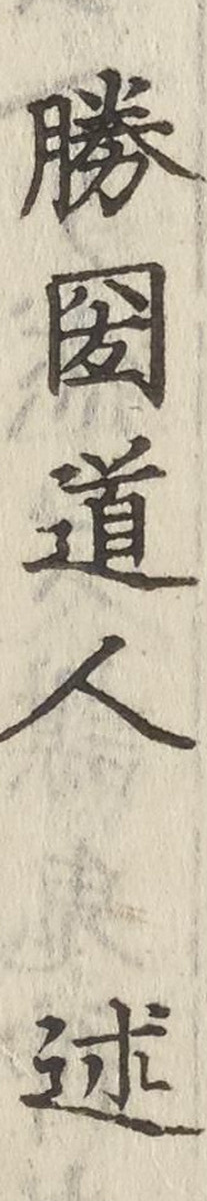勝圀道人述
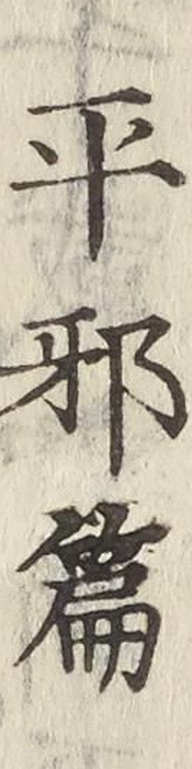平邪篇
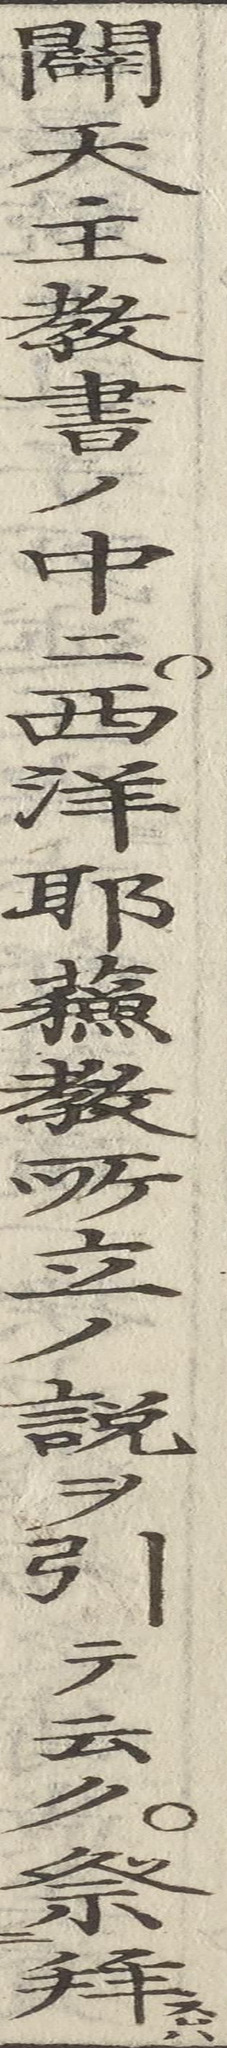闢天主教書ノ中ニ。西洋耶蘇教所立ノ説ヲ引テ云ク。祭拝
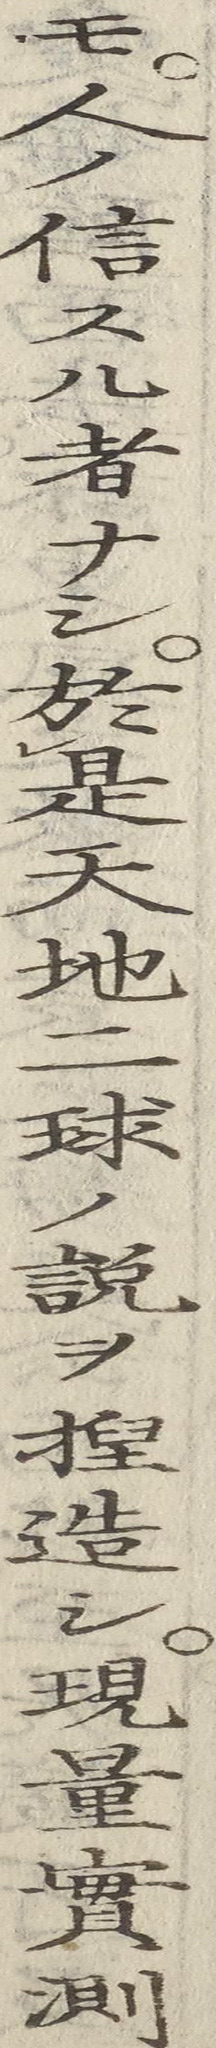モ。人ノ信スル者ナシ。於是天知二球ノ説ヲ捏造シ。現量実測

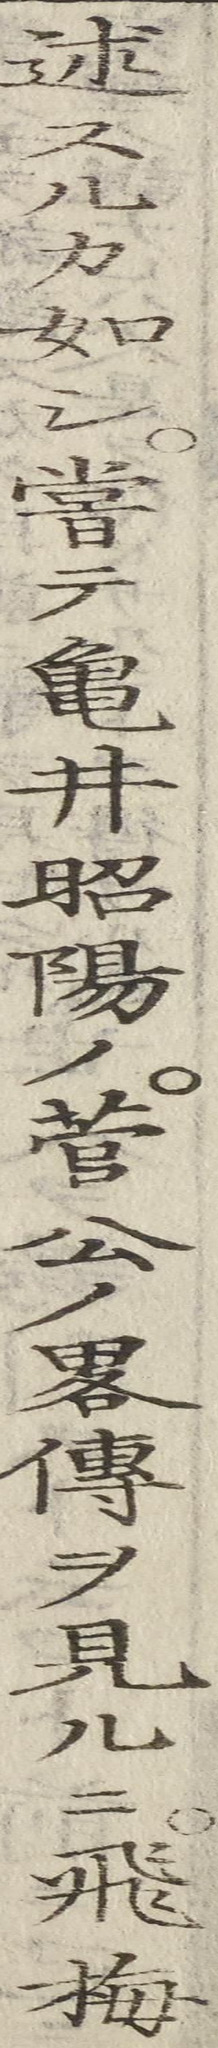述スルカ如シ。嘗テ亀井昭陽ノ。菅公ノ略伝ヲ見ルニ。飛梅
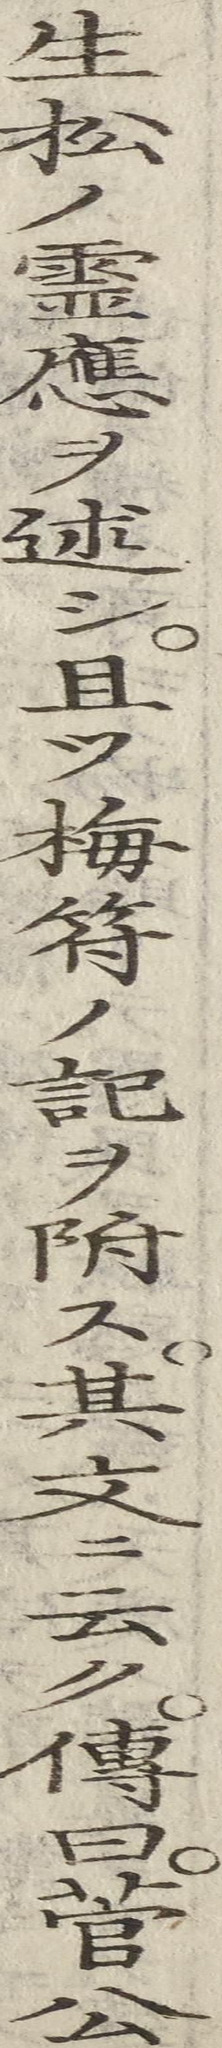生松ノ霊応ヲ述シ。且ツ梅符ノ記ヲ付ス。其文ニ云ク。伝曰。菅公
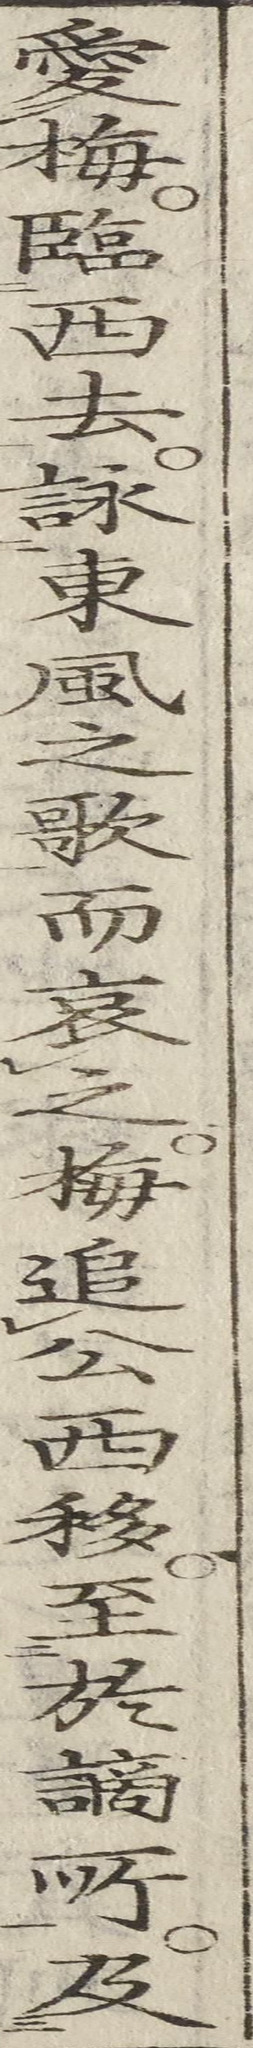愛梅。臨西去。詠東風之歌而哀之。梅追公西移。至於讁所。及
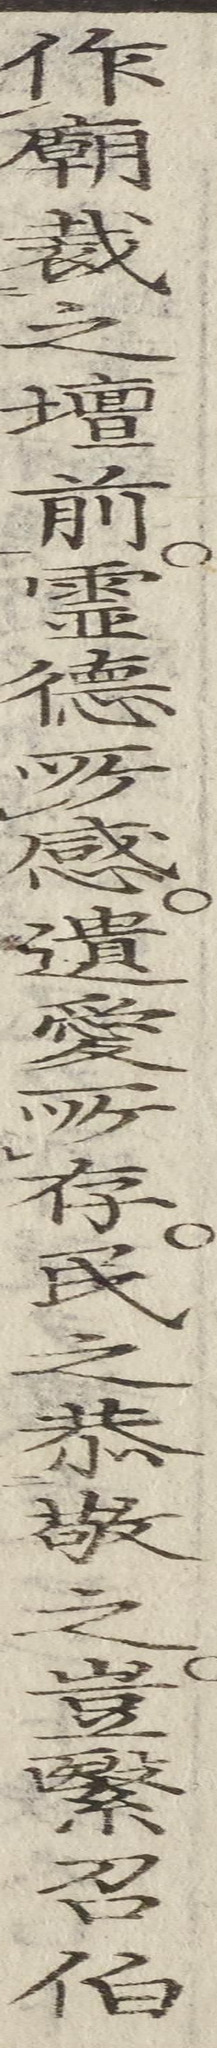作廟裁之壇前。霊徳所感。遺愛所存。民之恭敬之。豈繄召伯
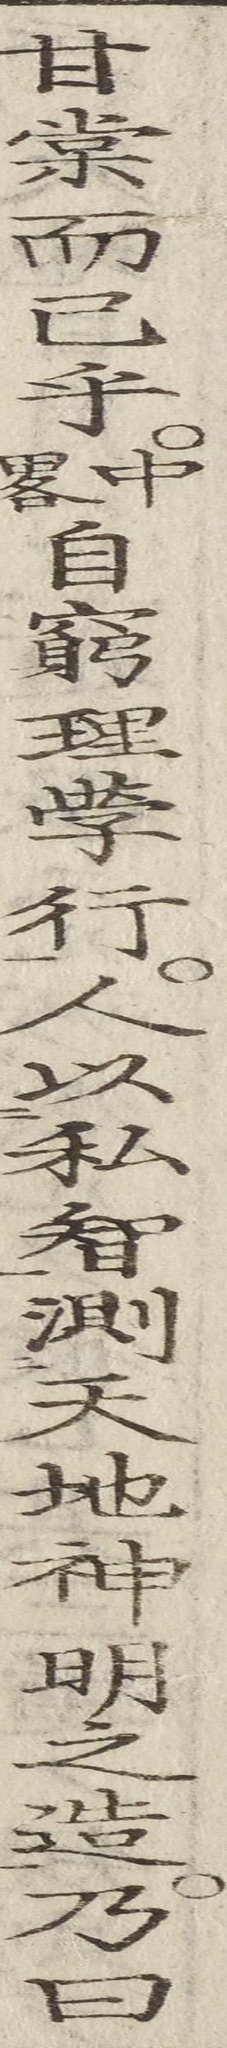甘棠而已乎。中略自窮理学行。人以私智測天地神明之造。乃曰
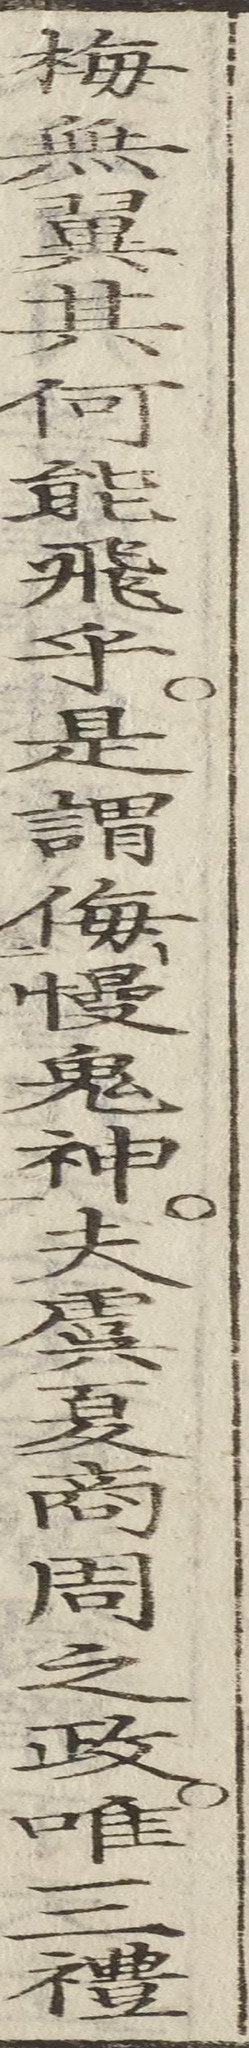梅無翼其何能飛乎。是謂梅－慢鬼神。夫虞夏商周之政。唯三礼
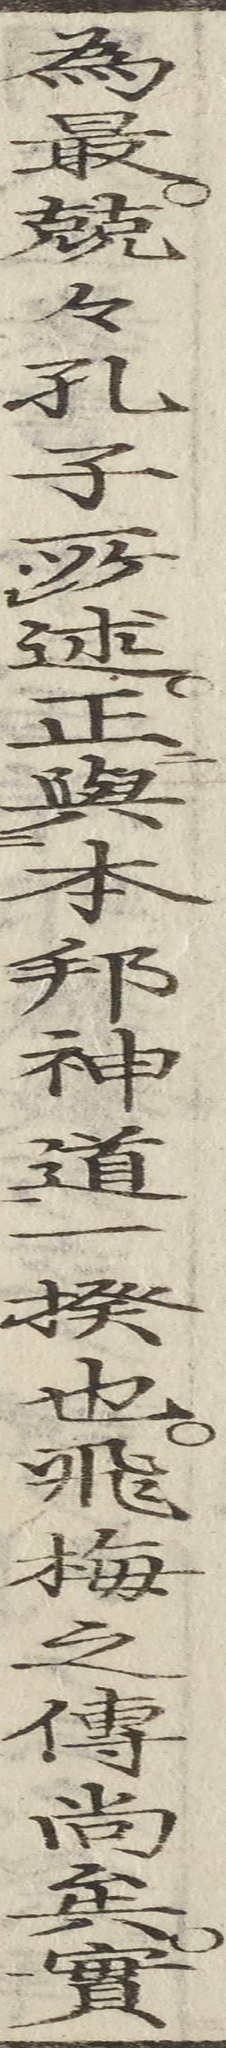為最。兢々孔子所述。正二与本邦神道一揆也。飛梅之伝尚矣。実
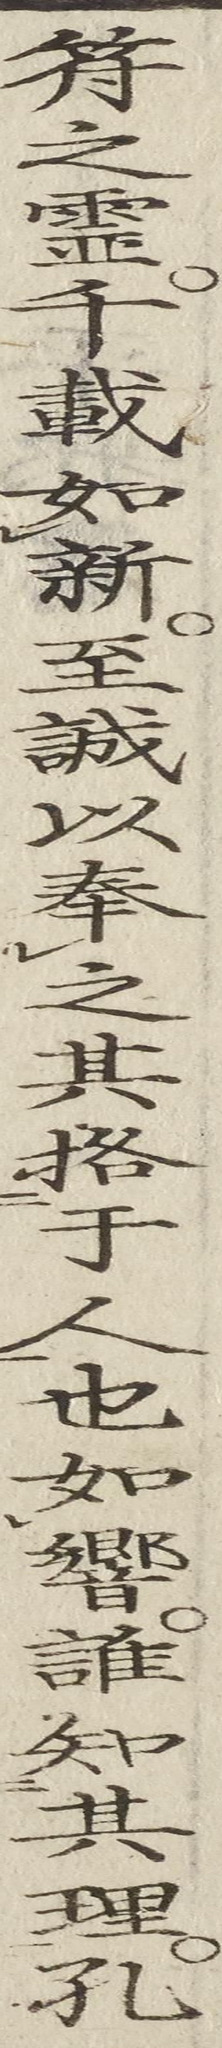符之霊。千載如新。至誠以奉之其格于人也如響。誰知其理。孔
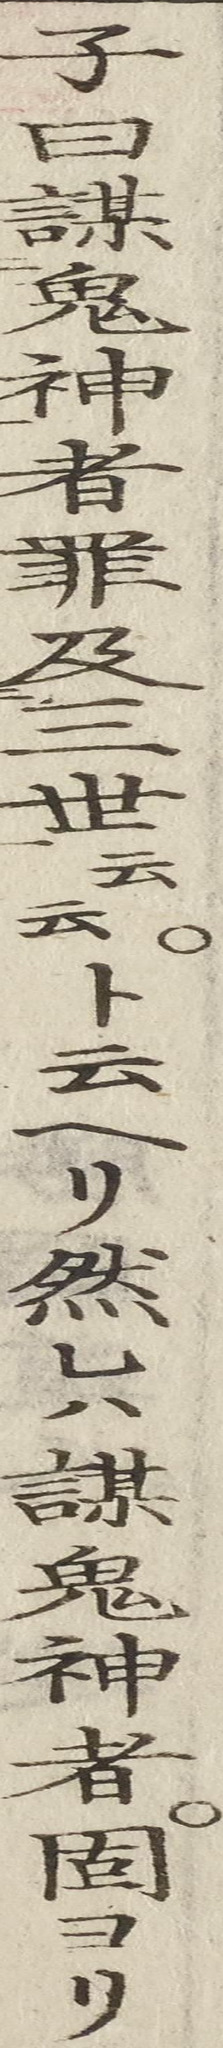子曰謀鬼神者罪及三世云云。ト云ヘリ然レハ謀鬼神者。固ヨリ
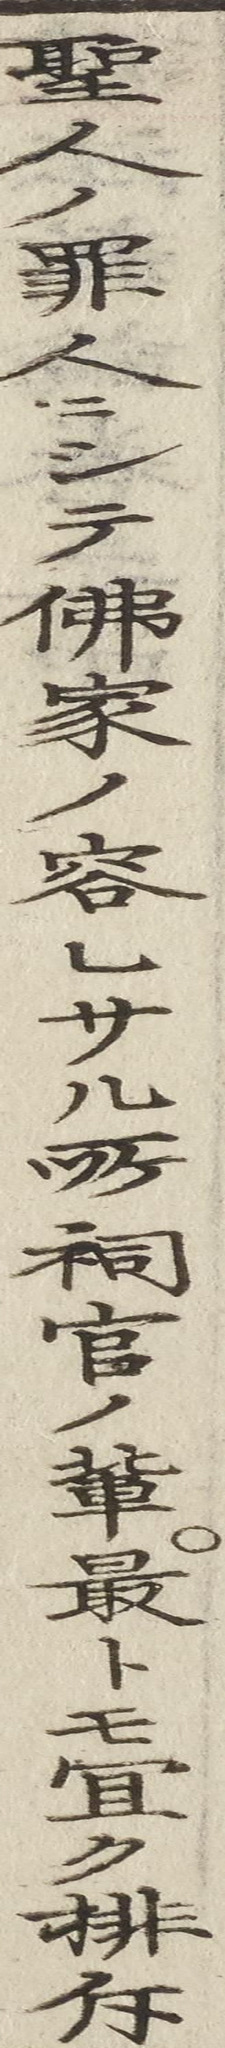聖人ノ罪人ニシテ仏家ノ容レサル所祠官ノ輩。最トモ冝ク排斥
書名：護法新論　中
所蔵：東京大学地震研究所図書室 Earthquake Research Institute Library, The University of Tokyo, JAPAN
